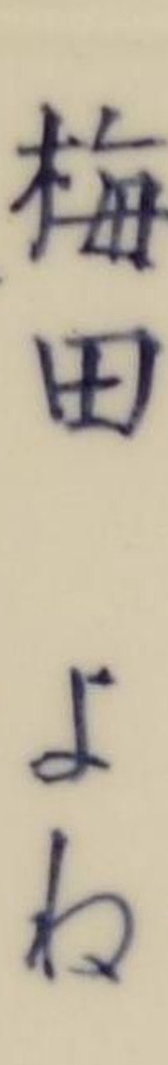梅田よね
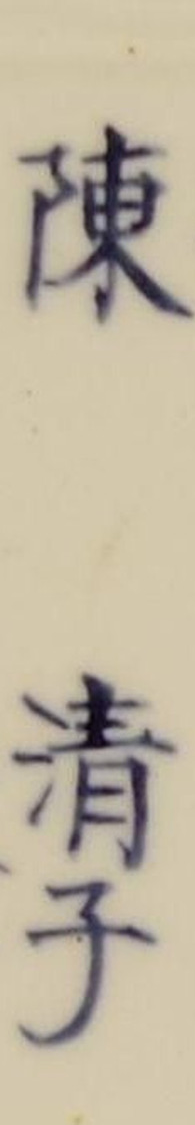陳清子
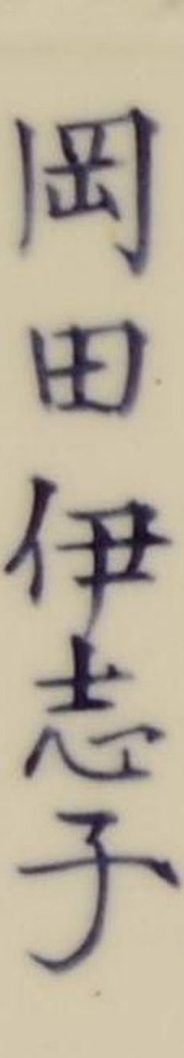岡田伊志子
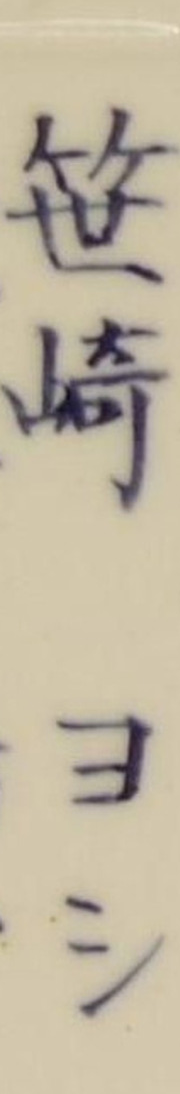笹崎ヨシ
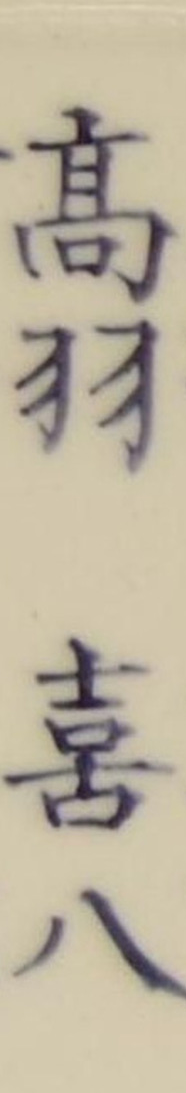高羽喜八

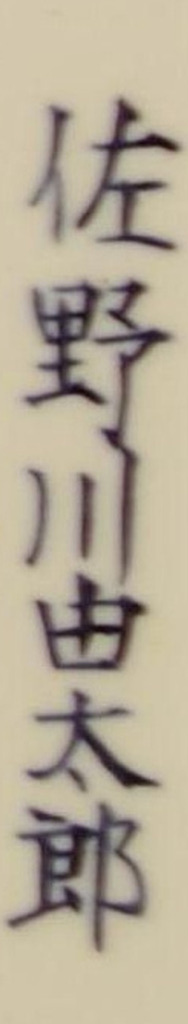佐野川由太郎
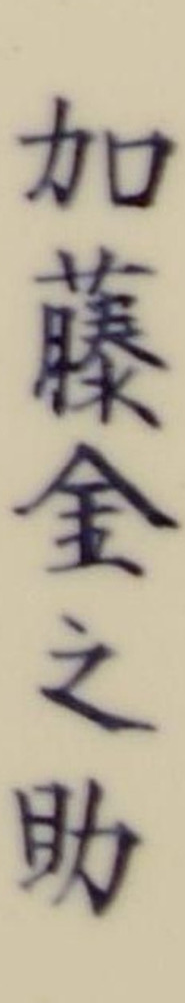加藤金之助
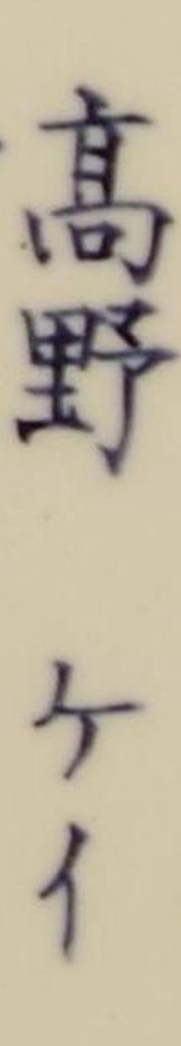高野ケイ
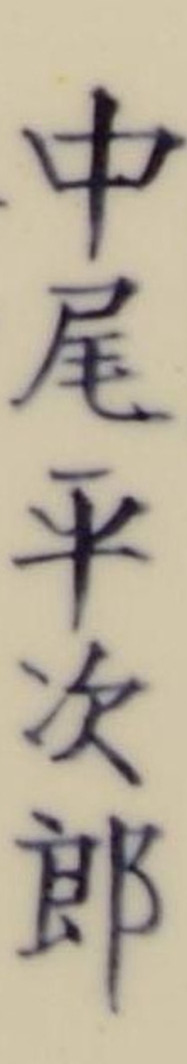中尾平次郎
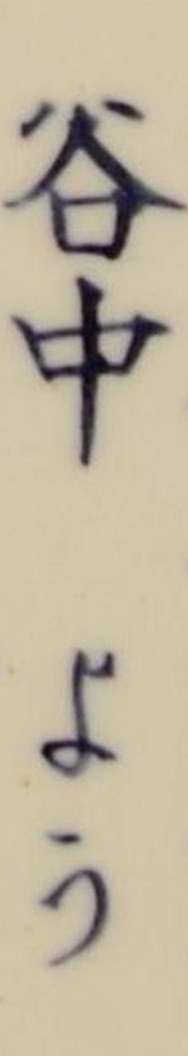谷中よう
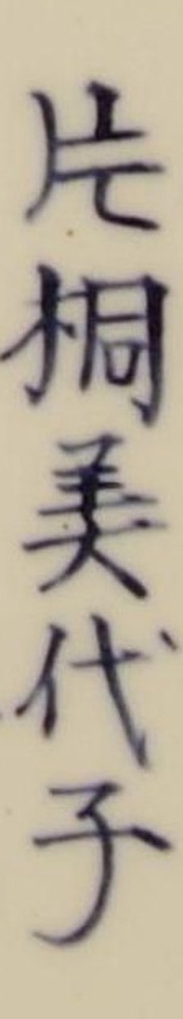片桐美代子
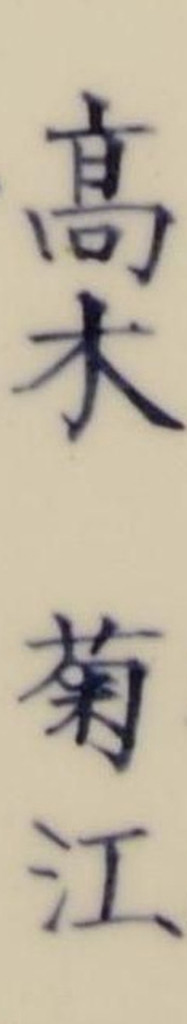高木菊江
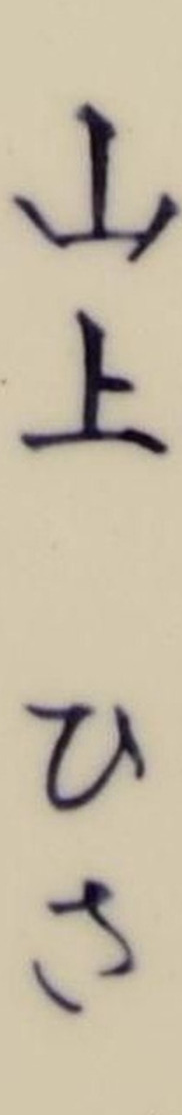山上ひさ
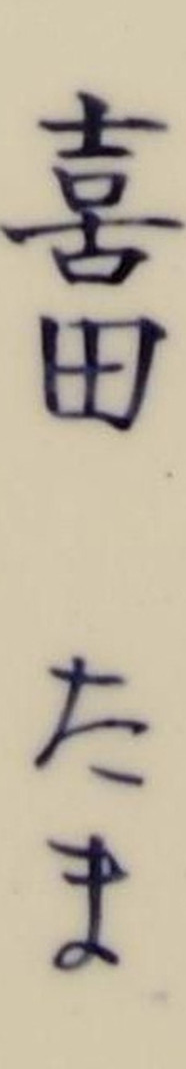喜田たま
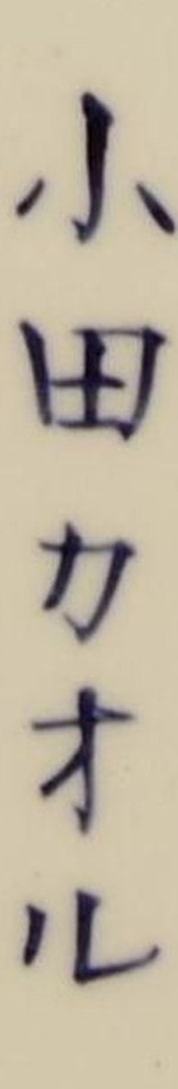小田カオル
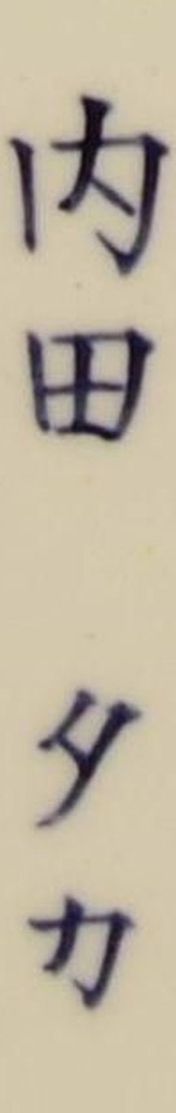内田夕カ
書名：E~L
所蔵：高野山金剛峯寺
